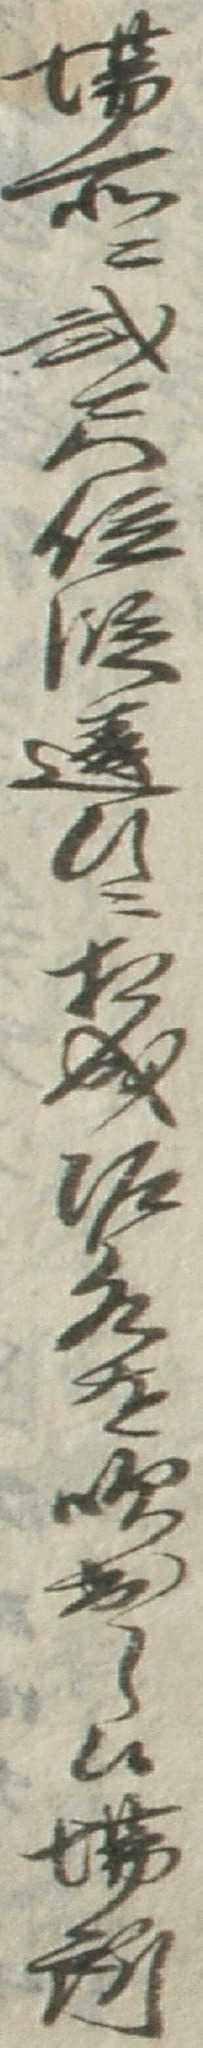場所二弐尺位段違ひ二相成泥水を吹出し候場所

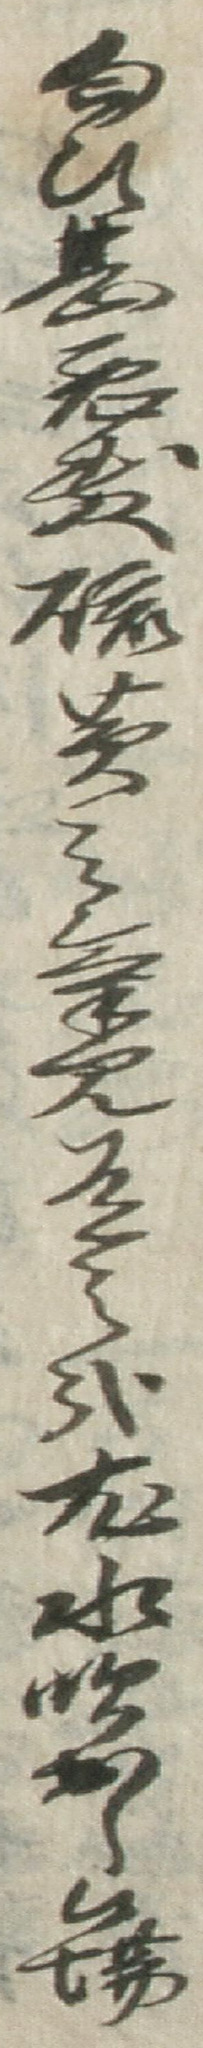匂ひ甚悪敷硫黄之気見有之哉尤水吹出し候場
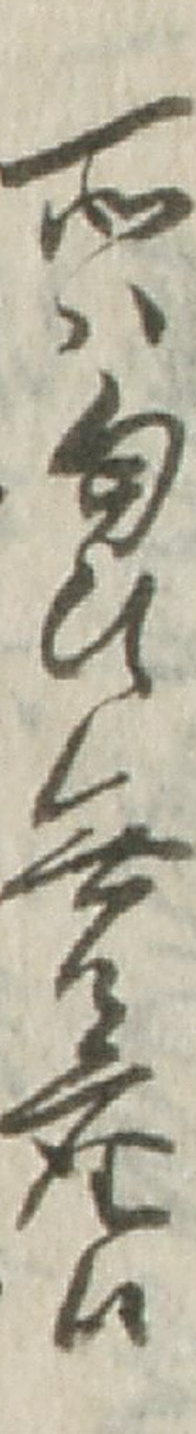所は匂ひ無御座候
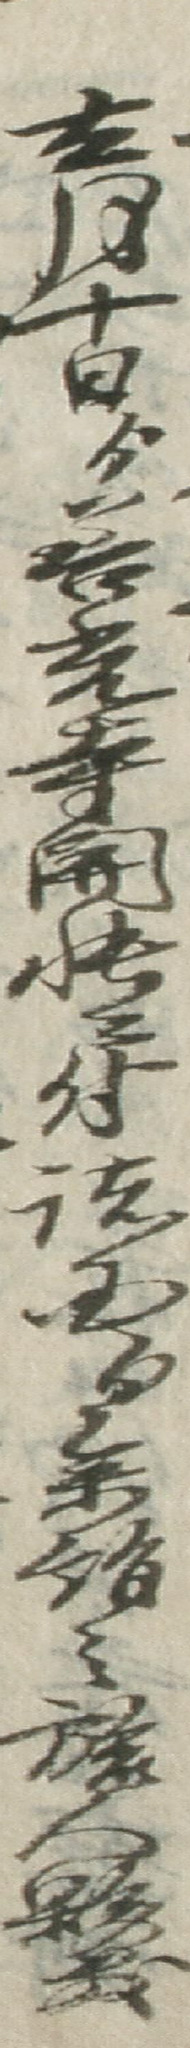一去月十日ゟ善光寺開帳二付諸国ゟ参詣之旅人
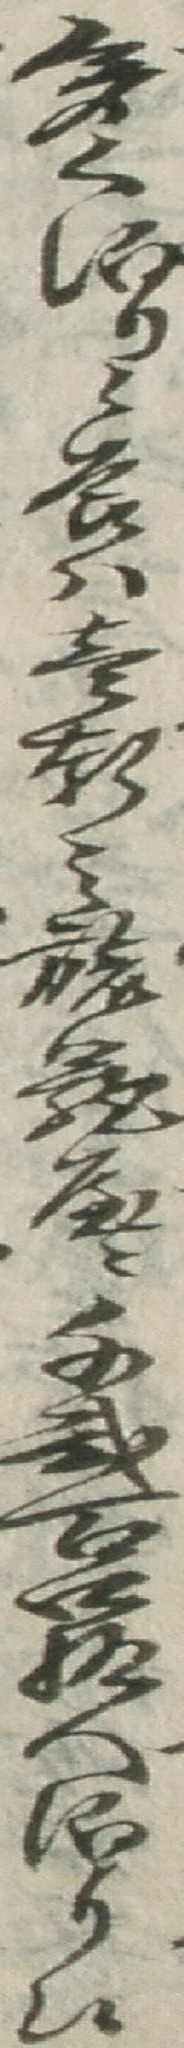多く泊り候節ハ壱軒之旅籠屋二千弐百四拾人泊り候
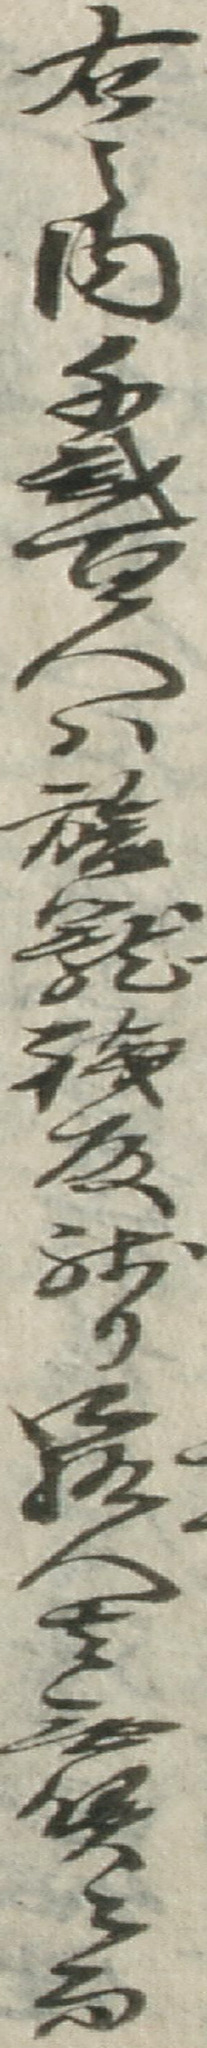右之内千弐百人ハ旅籠銭取残り四拾人は無賃二而
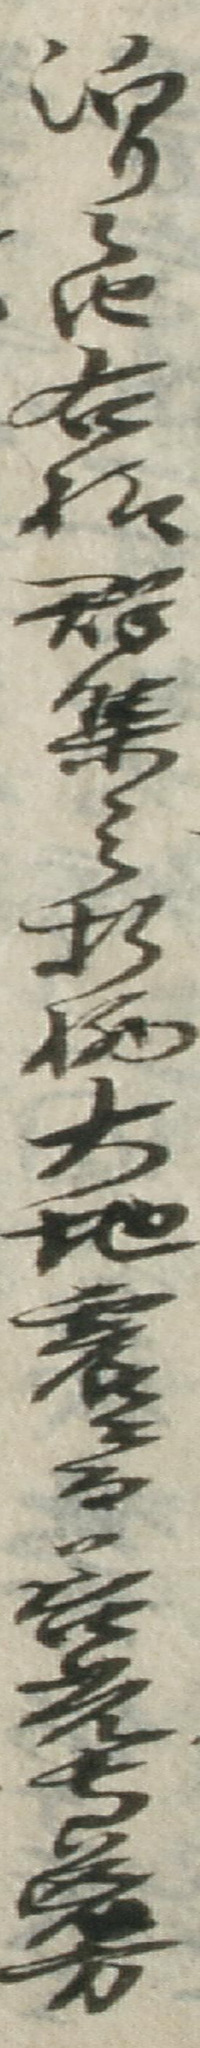泊り候由右様群集之折柄大地震二而善光寺方
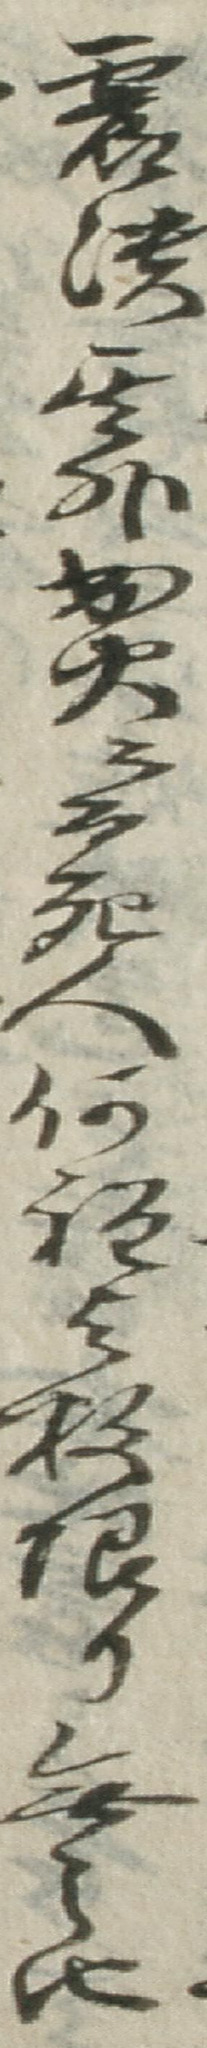震潰其外出火二而死人何程と数限り無之由
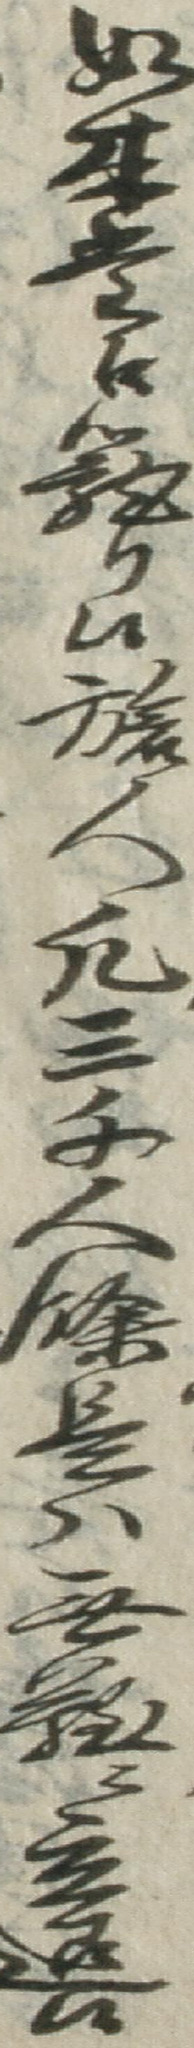如来堂江籠り候旅人凡三千人餘是ハ無難二立退候
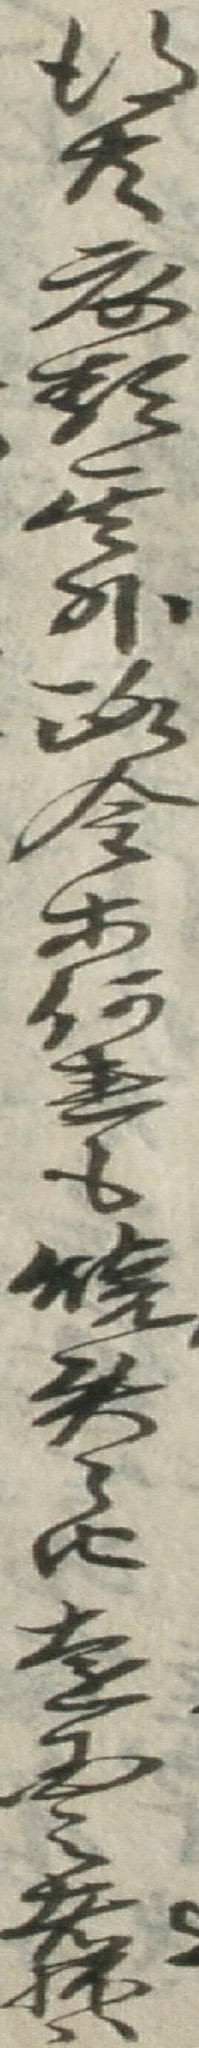得共衣類其外路金等何れも焼失之由遠国之者抔ハ
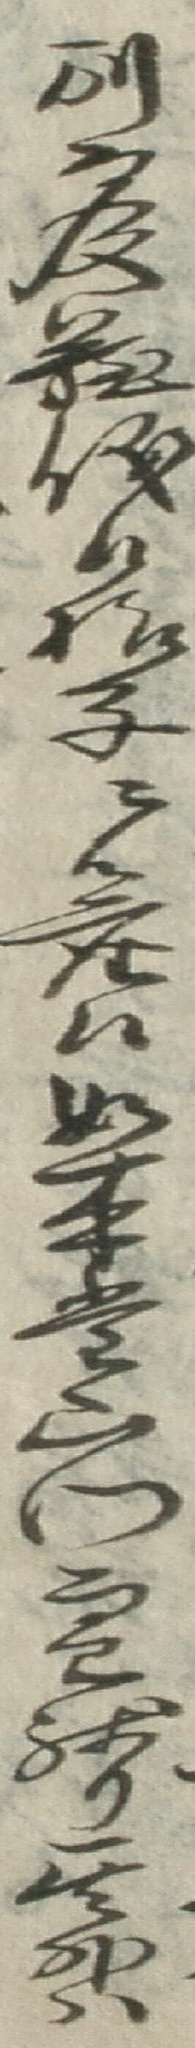別而及難儀候様子二御座候如来堂山門而已残り其外ハ
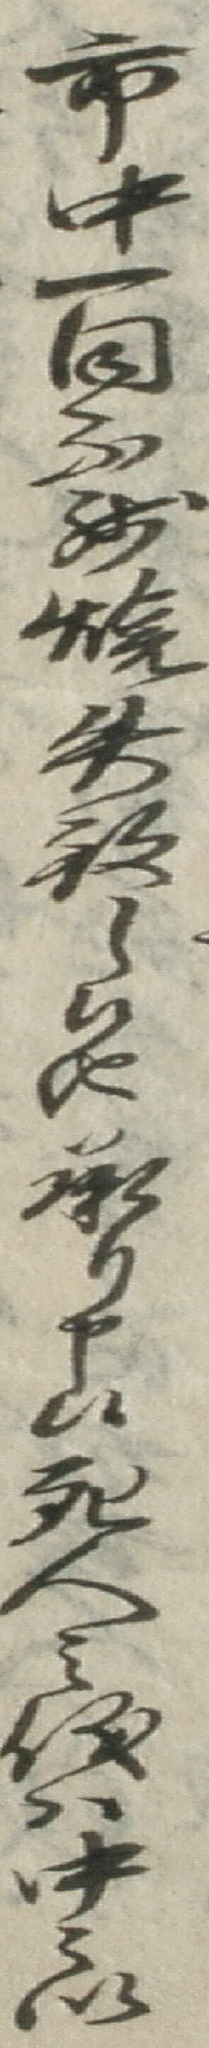市中一同不残焼失致し候由承り申候死人之儀ハ中々以
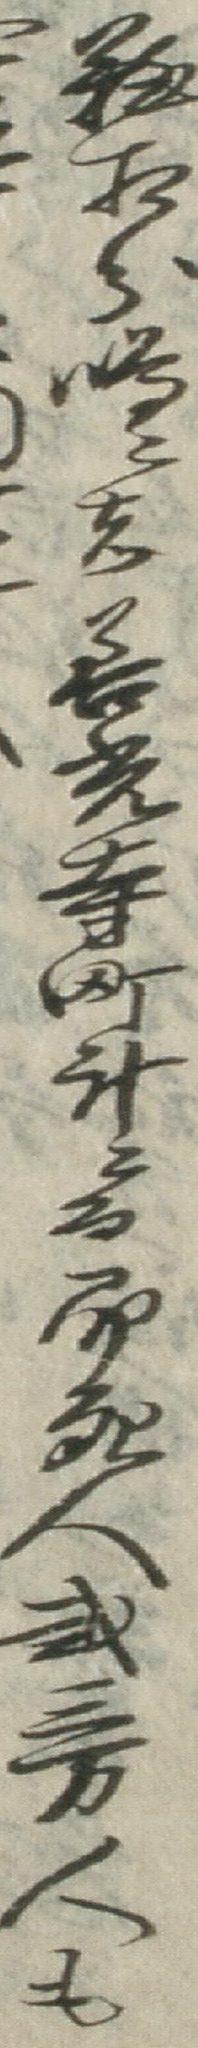難相分噂二は善光寺町計二而即死人弐三万人も
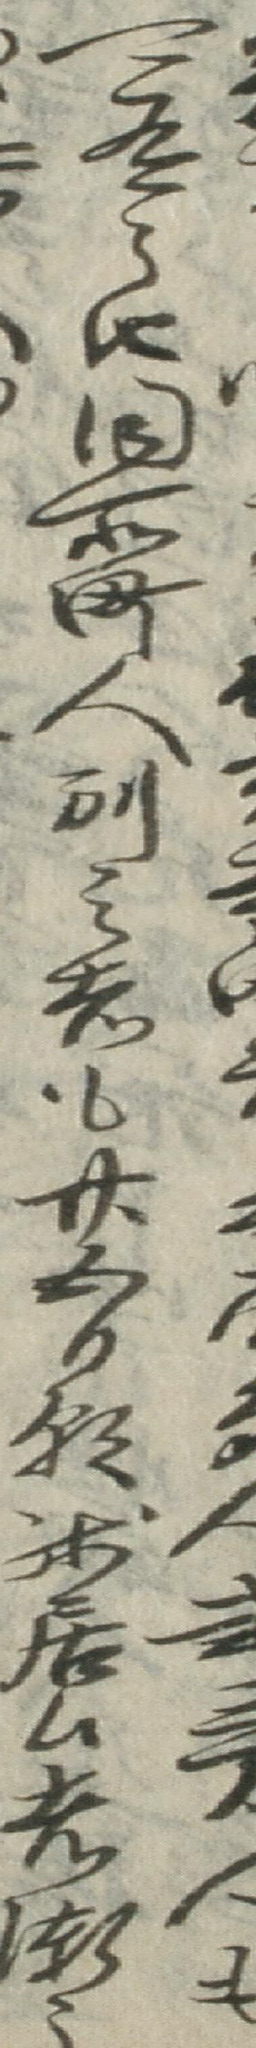可有之由同所町人別之者も廿五日朝残居候者漸々
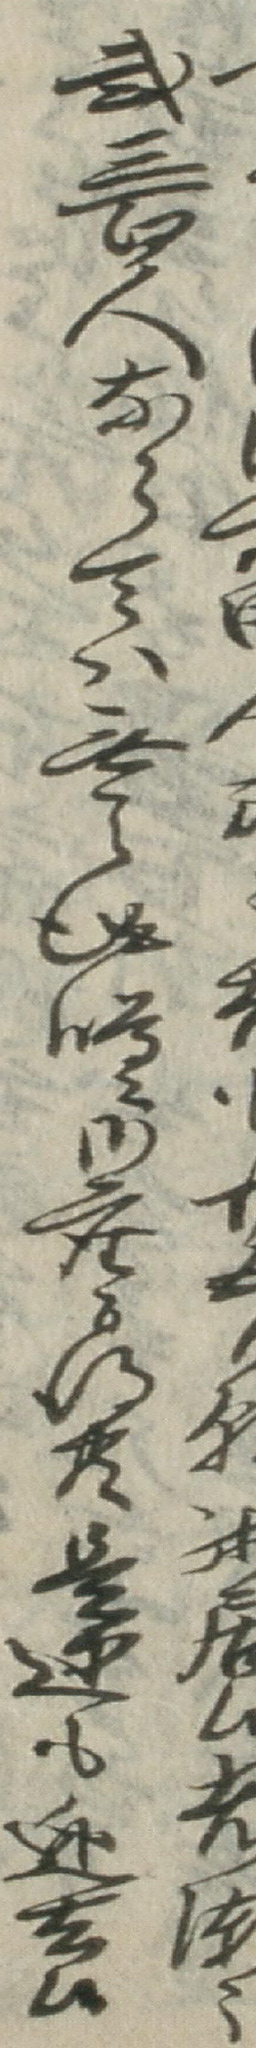弐三百人ならてハ無之趣噂二御座候得共是迚も逃去候
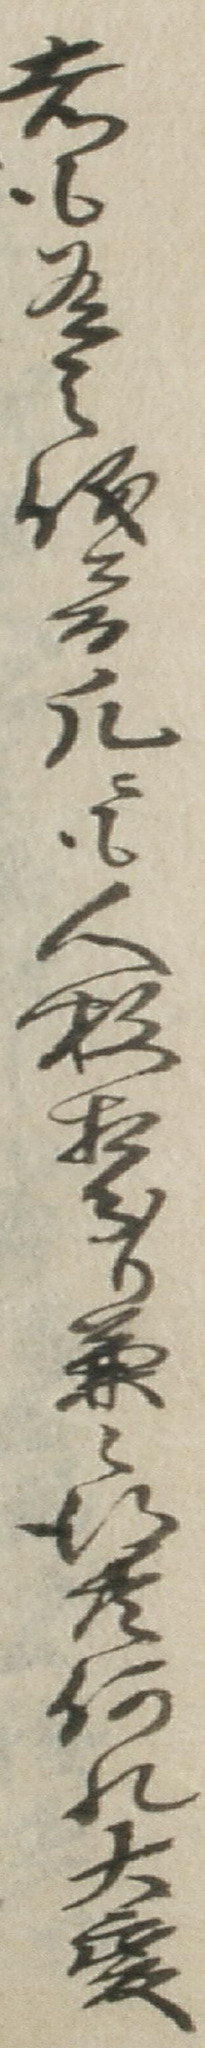者も有之儀二而凡二も人数相分兼候得共何れ大変
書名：信濃國地震實録記
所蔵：東京大学地震研究所図書室 Earthquake Research Institute Library, The University of Tokyo, JAPAN
